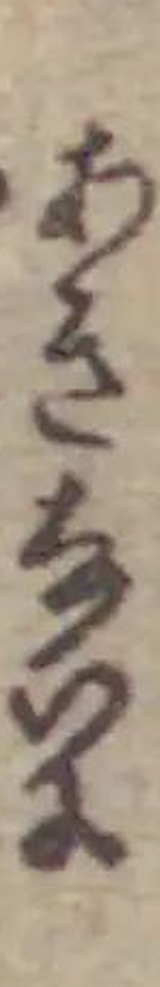あきないに
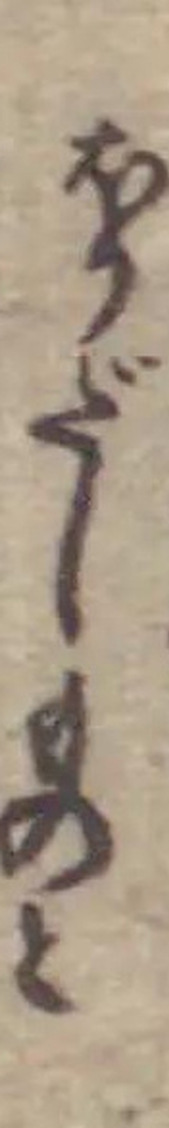ほりだしものと
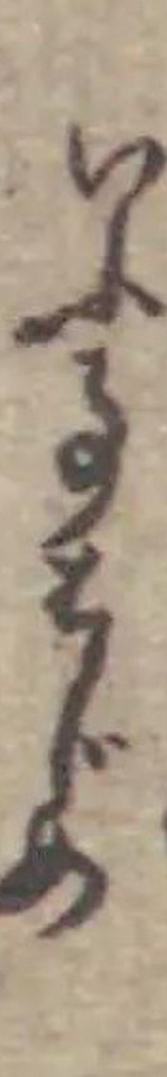いふ事はじめ

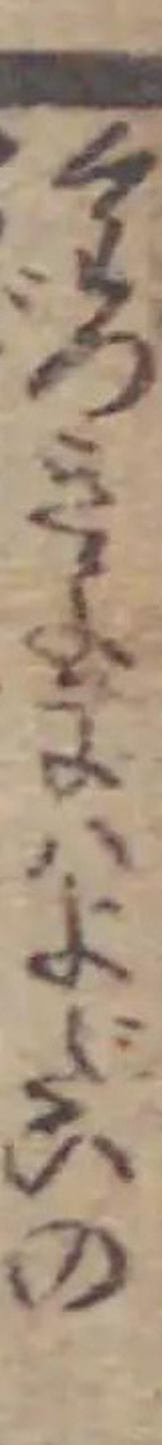くわつきよにはよだいの
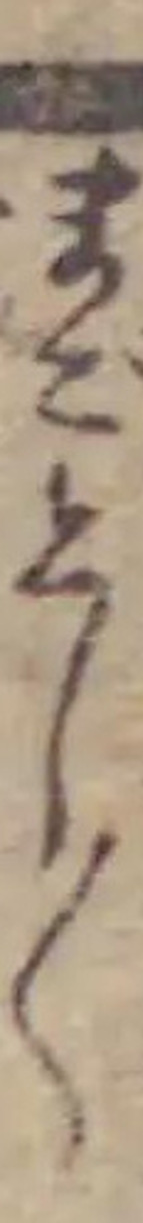まごとし〳〵
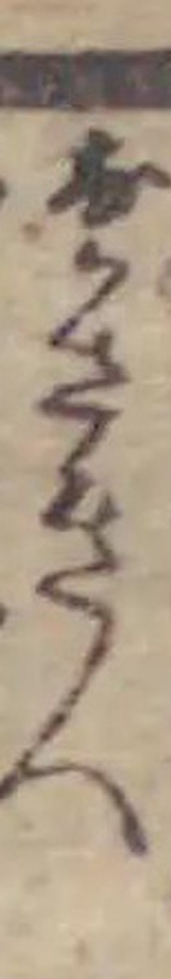おかさきへ
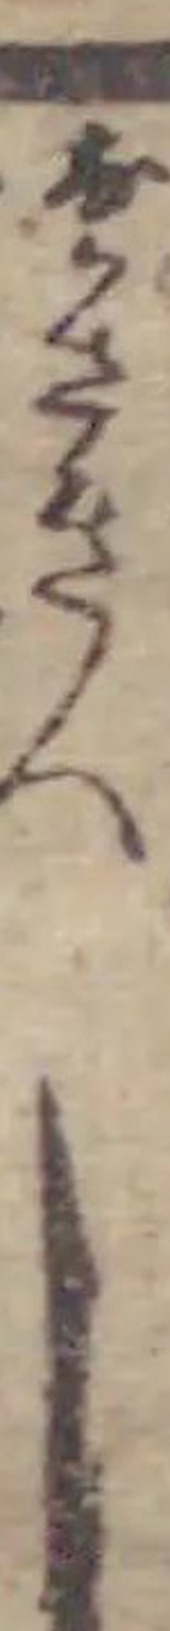おかさきへ
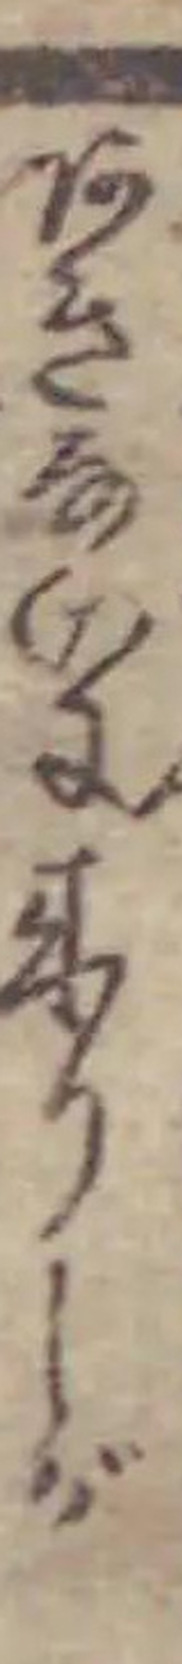あきないに来りしが
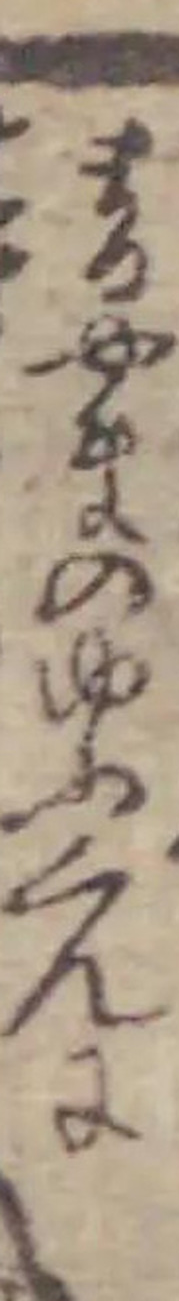まるやまのゆふくんに
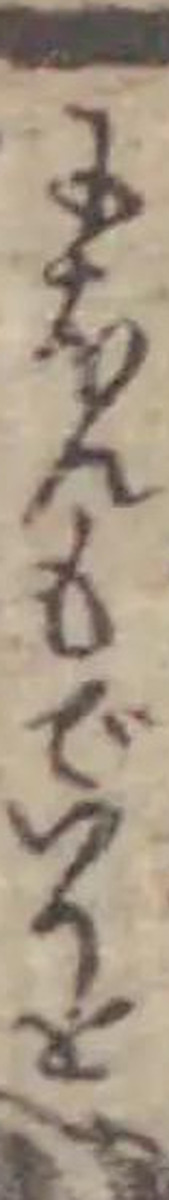にほんもでいりを
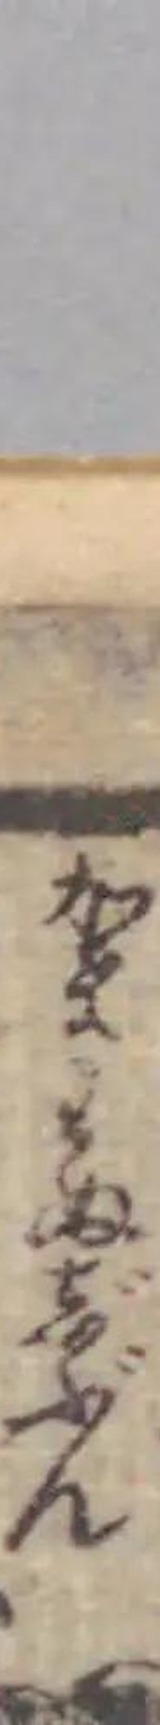かまわぬじぶん
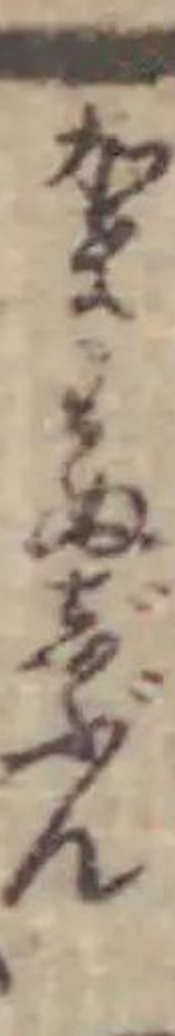かまわぬじぶん
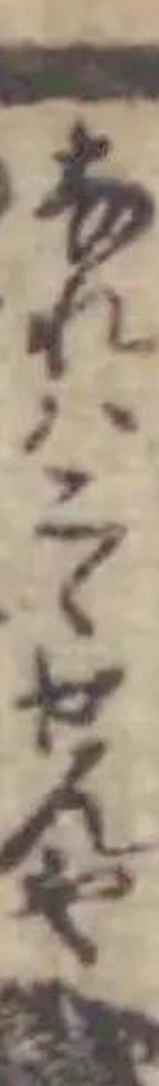なれはこくせんや
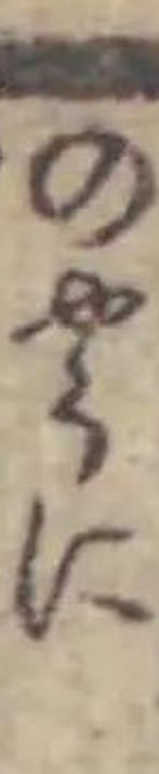のやうに
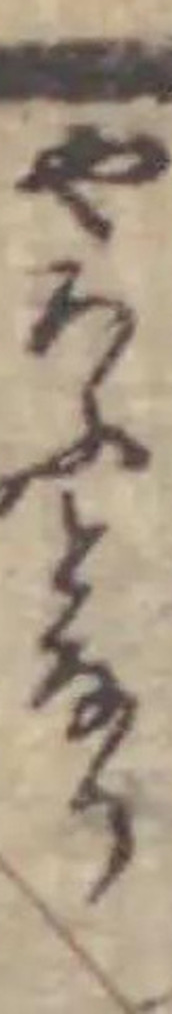やろふとなり
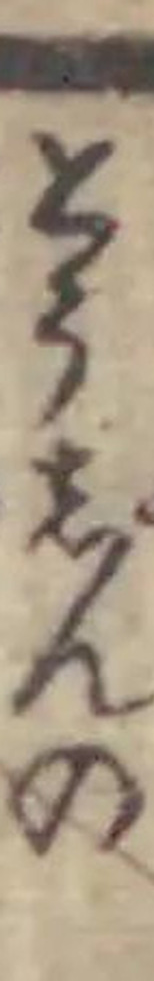とうしんの
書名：間違月夜鍋 2巻
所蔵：国立国会図書館 National Diet Library, JAPAN
